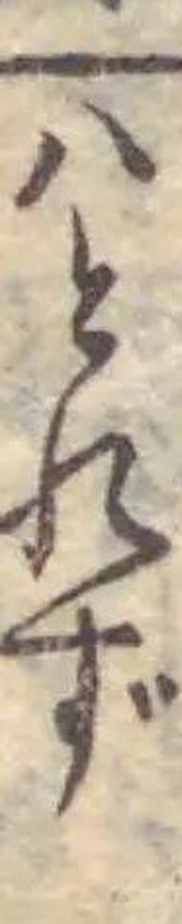はとれず
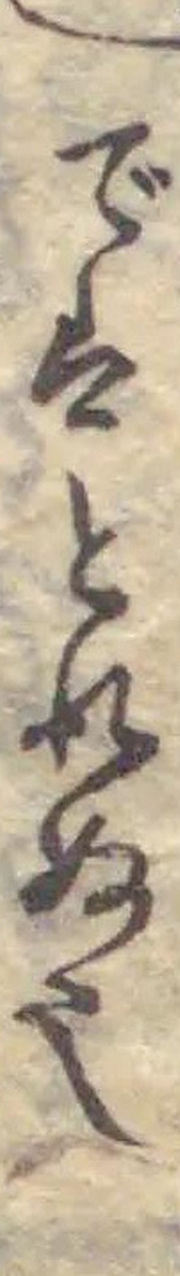ではとれぬ也
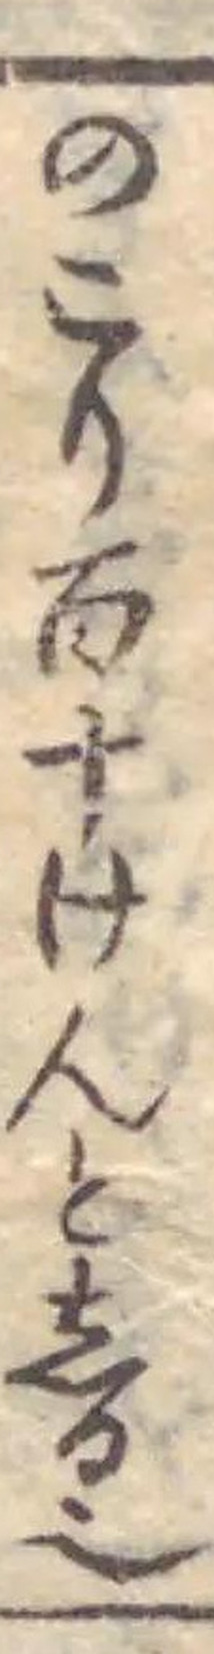のこり百十けんとしる也
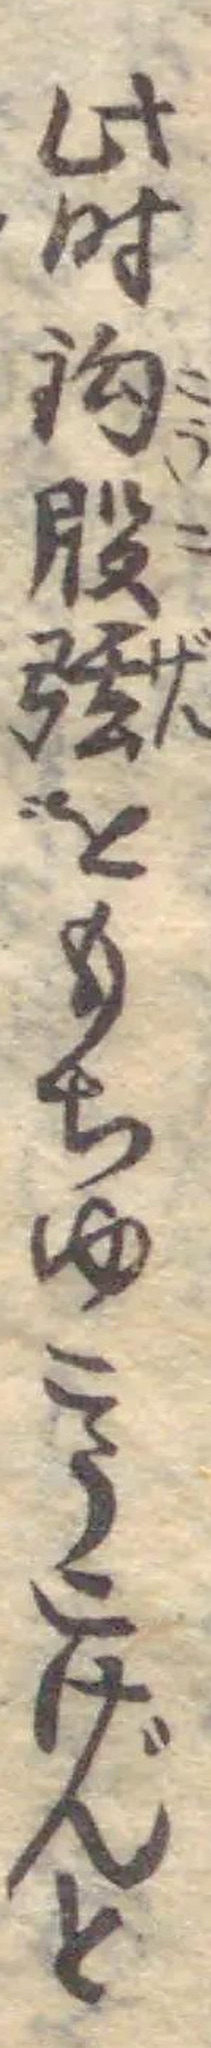此時鈎股弦をもちゆこうこげんと
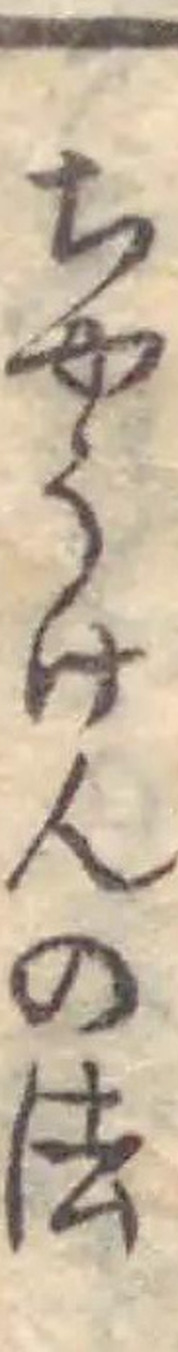ちやうけんの法
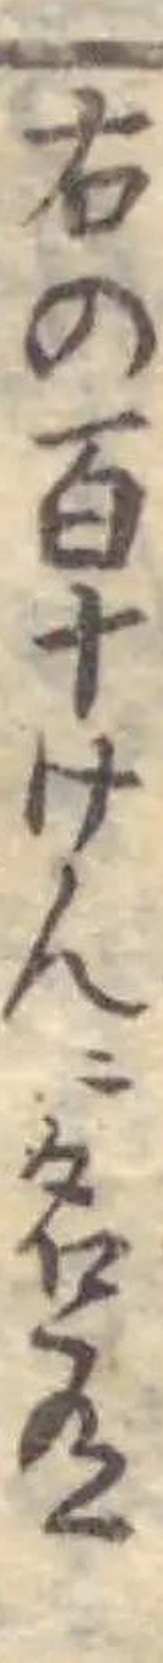右の百十けんに名有
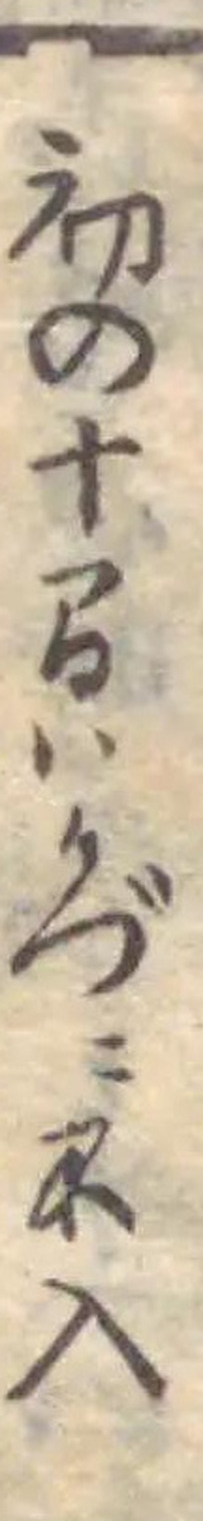初の十間はかづに不入
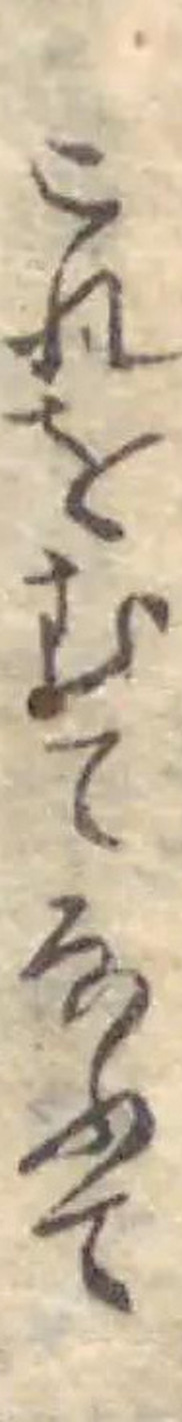これをむてなふて
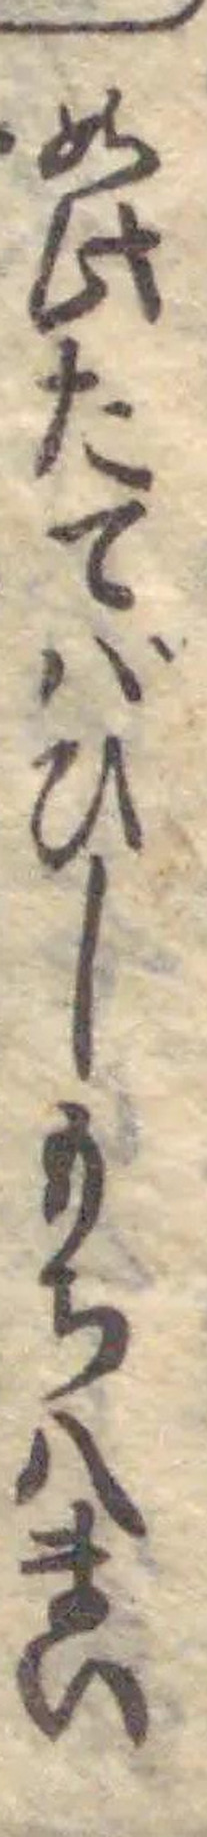如此たてばひしもち八枚
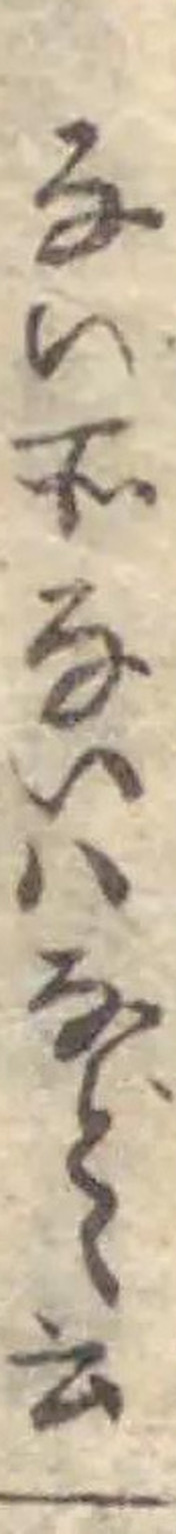ない所ないはなどゝ云
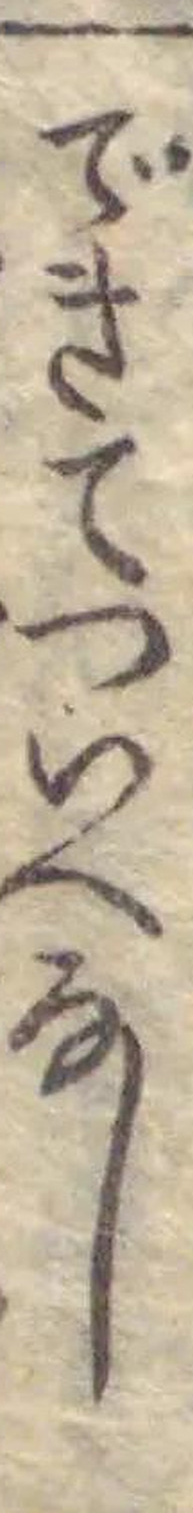できてついへなし
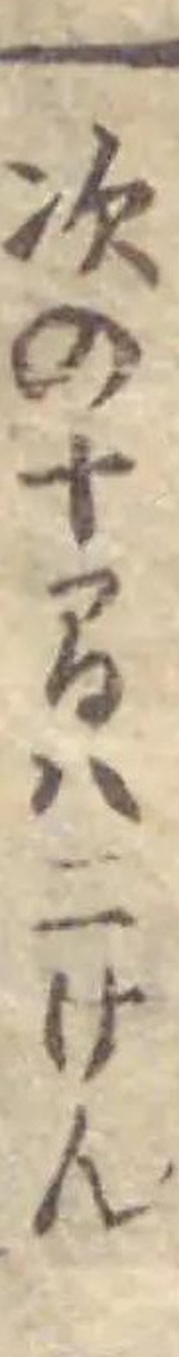次の十間は二けん
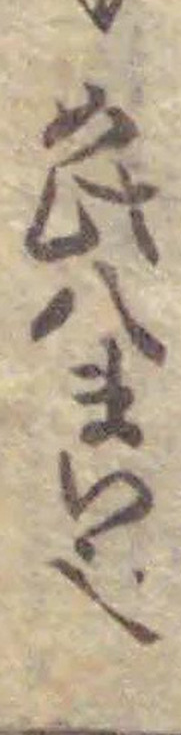如此八まい也

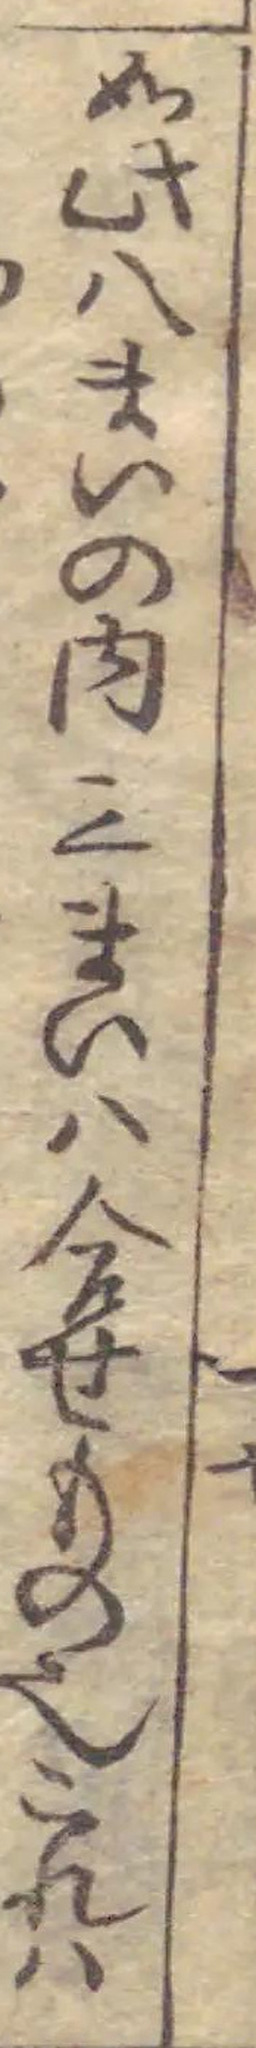如此八まいの内三まいは合せもの也これは
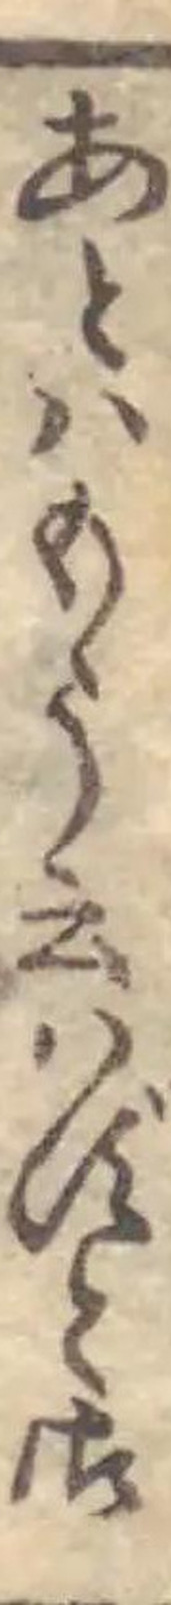あとはもう云はずと御
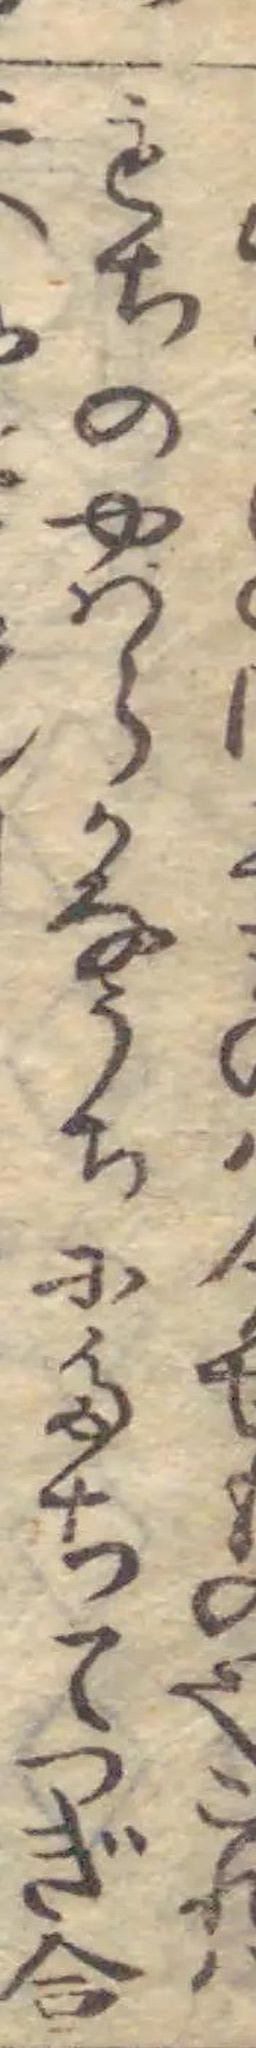もちのやはらかなうちにたちてつぎ合
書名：大通人好記
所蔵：国立国会図書館 National Diet Library, JAPAN
